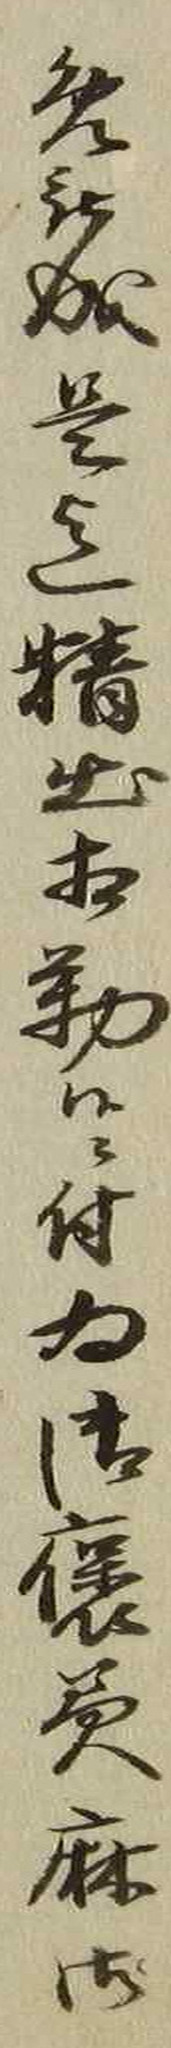免被成是迄精出相勤候に付為御褒美麻御
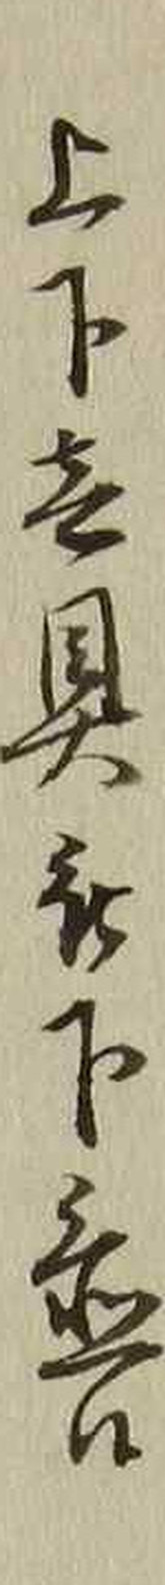上下壱具被下置候
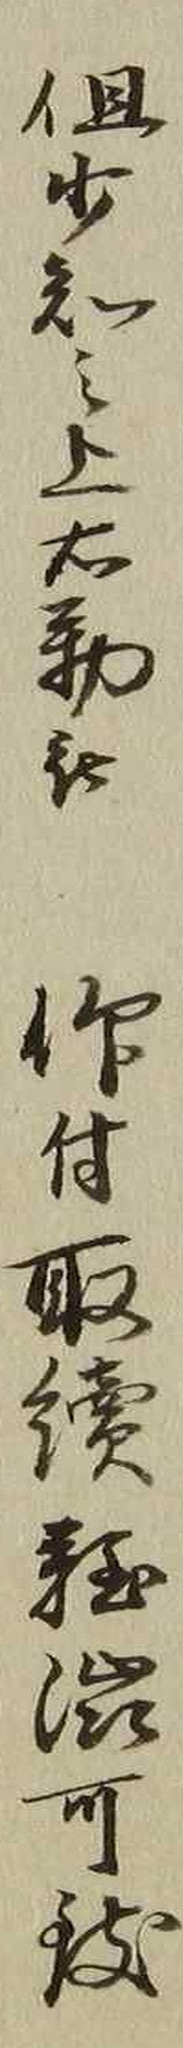但少知之上右勤被仰付取続難渋可致
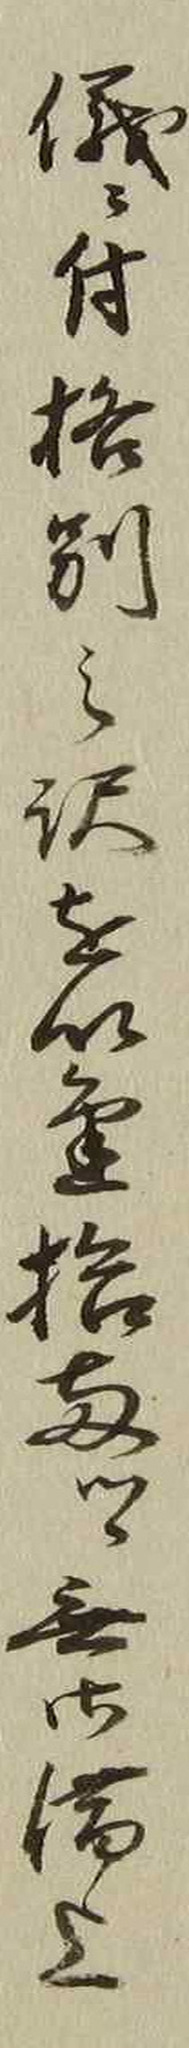儀に付格別之訳を以金拾両つヽ無御借上
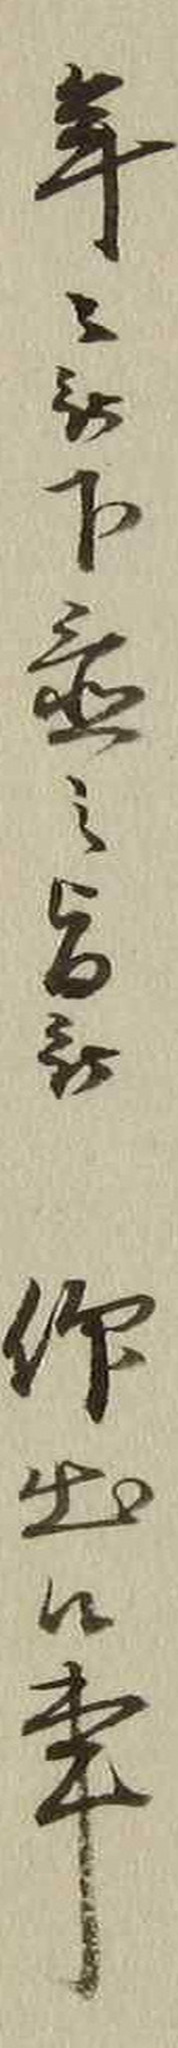年々被下置之旨被仰出候事
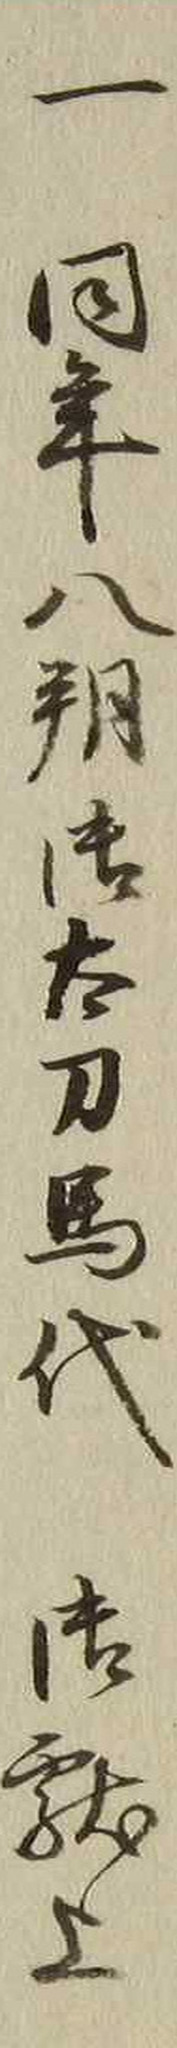一同年八朔御太刀馬代御献上
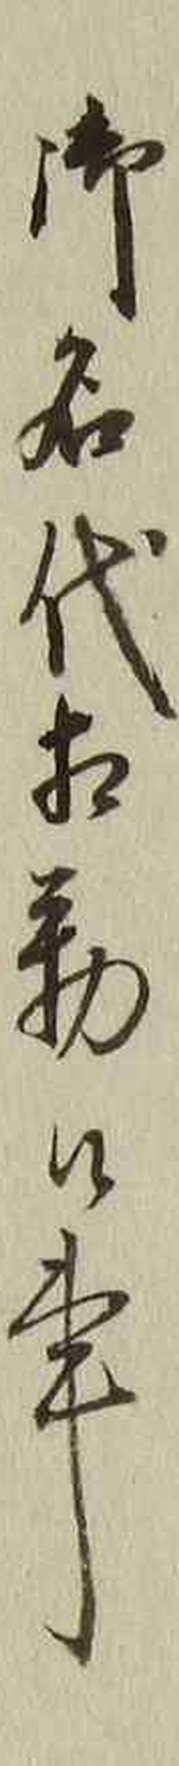御名代相勤候事
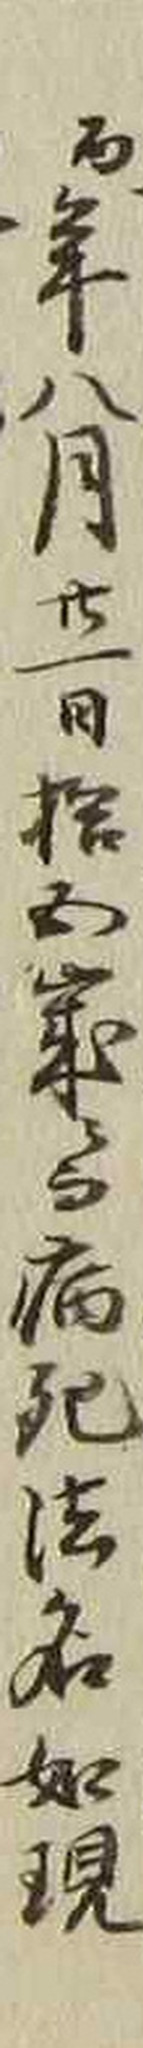酉年八月廿一日拾五歳に而病死法名如現
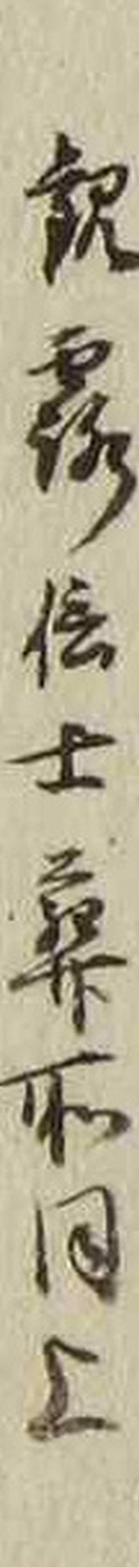観露信士葬所同上
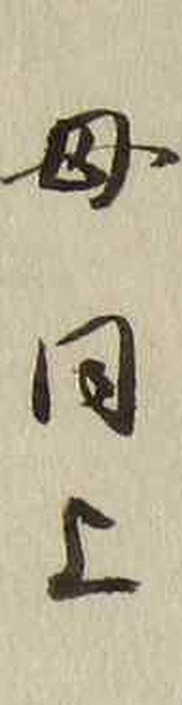母同上
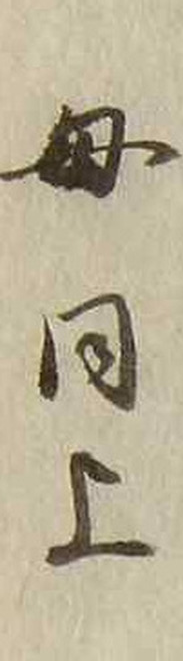母同上

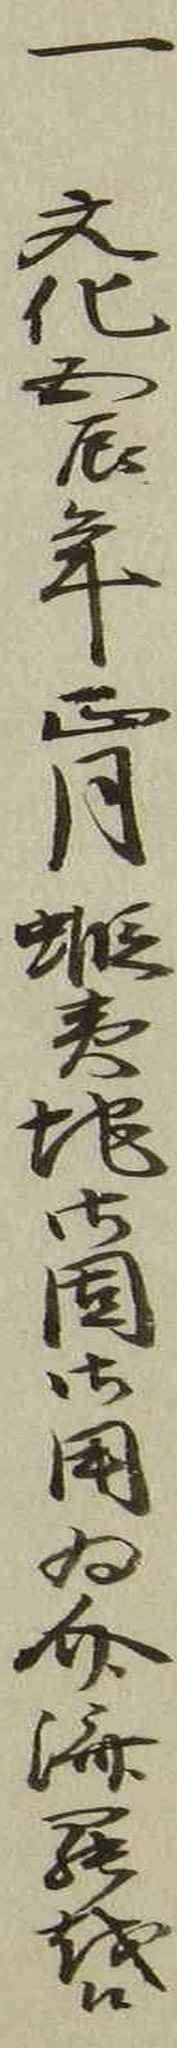一文化五辰年正月蝦夷地御固御用為介添罷越候
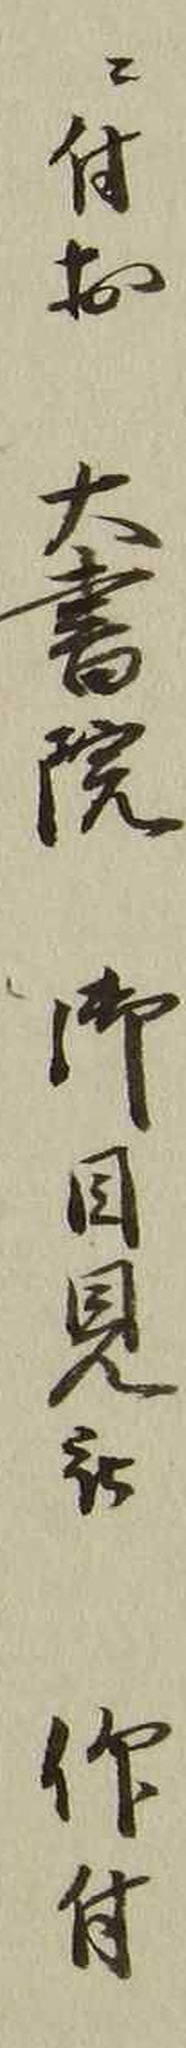に付於大書院御目見被仰付
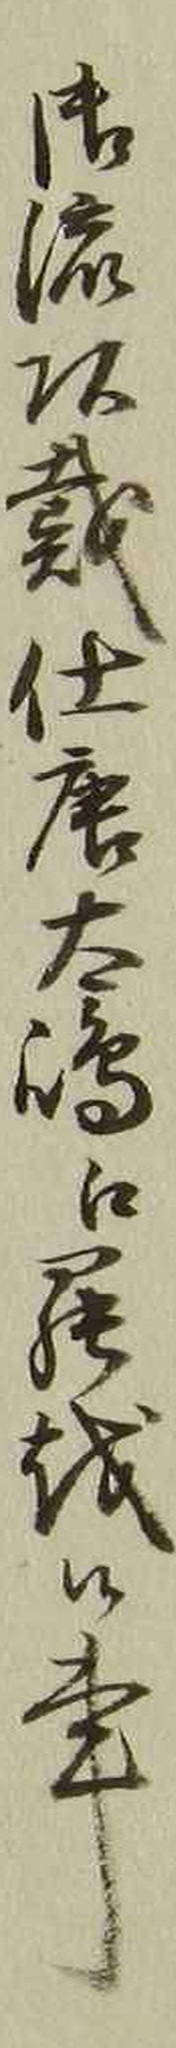御流頂戴仕唐太嶋江罷越候事
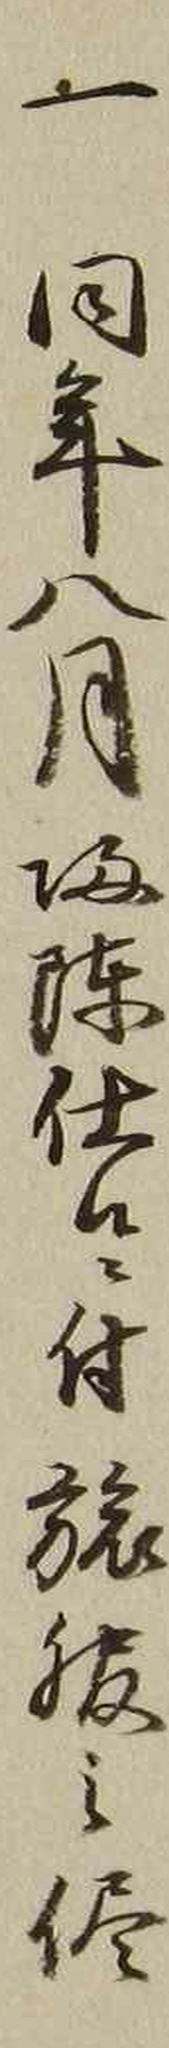一同年八月帰陣仕候に付旅服之侭
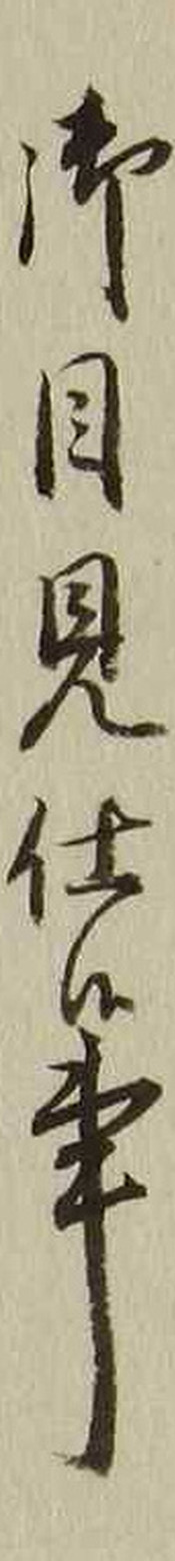御目見仕候事
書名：諸士系譜　巻之133　た之部9
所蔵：会津若松市立会津図書館
